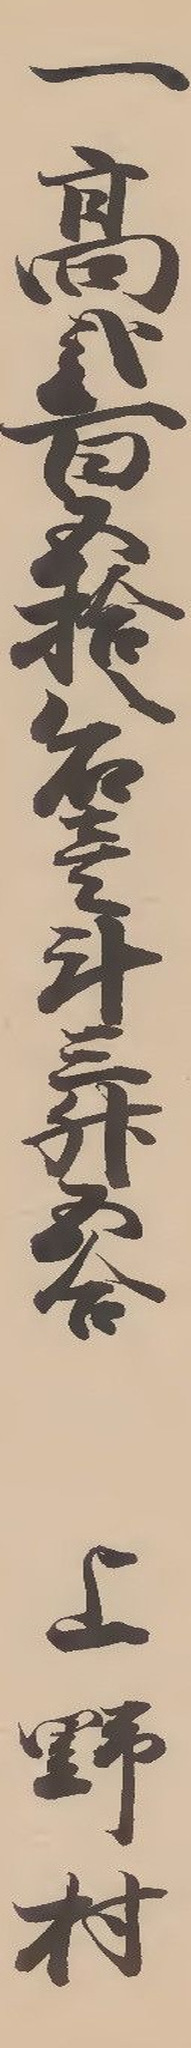一高弐百五拾八石壱斗三升五合上野村
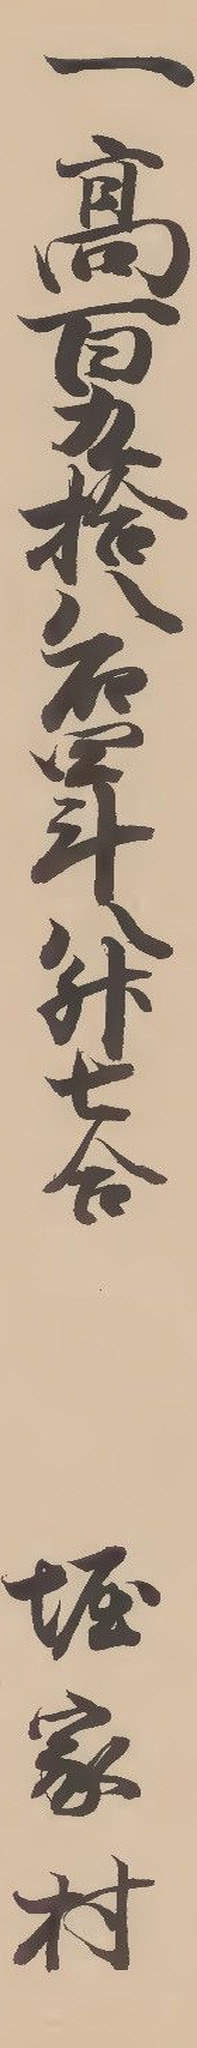一高百九拾八石四斗八升七合堀家村
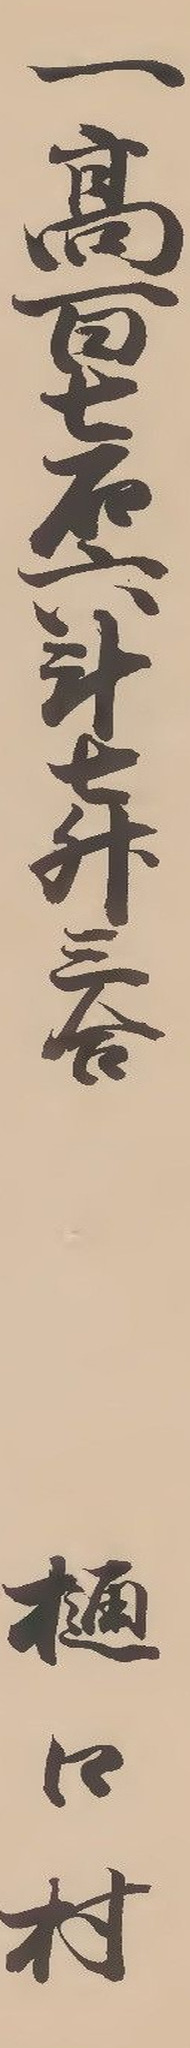一高百七石六斗七升三合樋口村
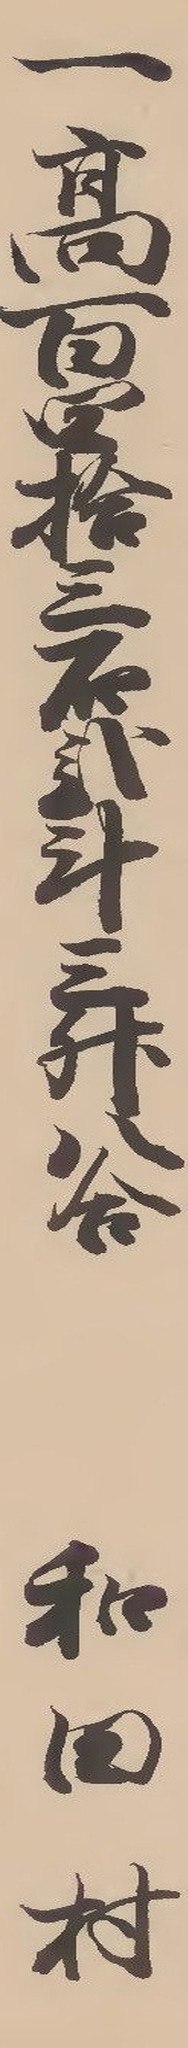一高百四拾三石弐斗三升八合和田村
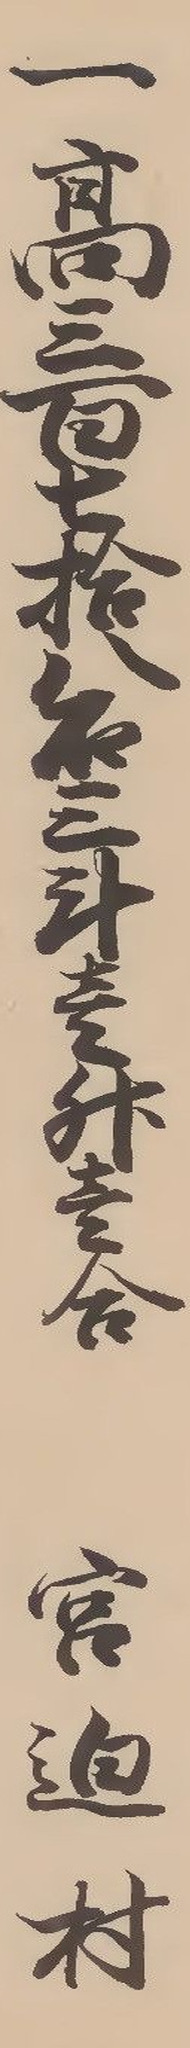一高三百七拾八石三斗壱升壱合宮迫村
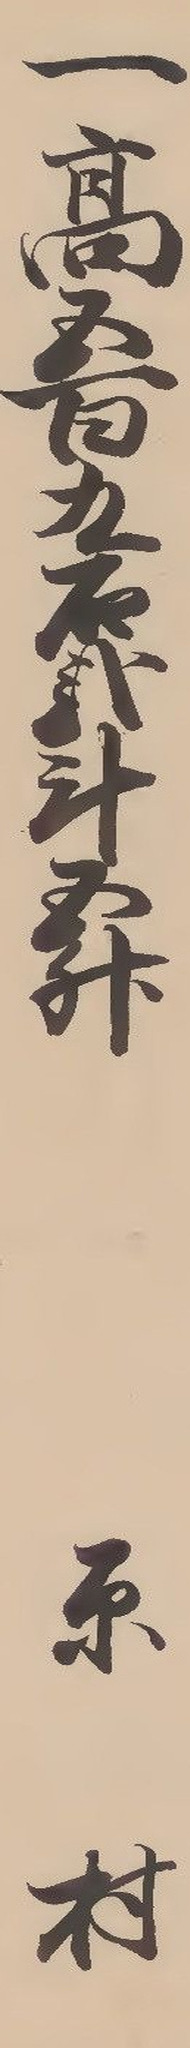一高五百九石弐斗五升原村
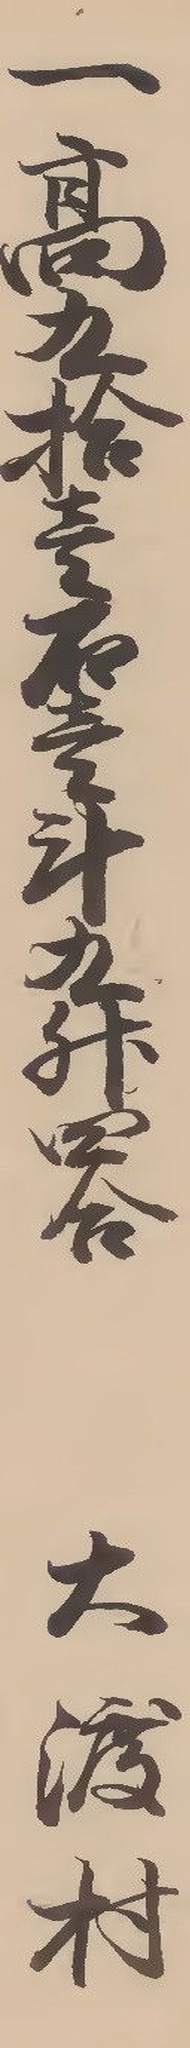一高九拾壱石壱斗九升四合大渡村

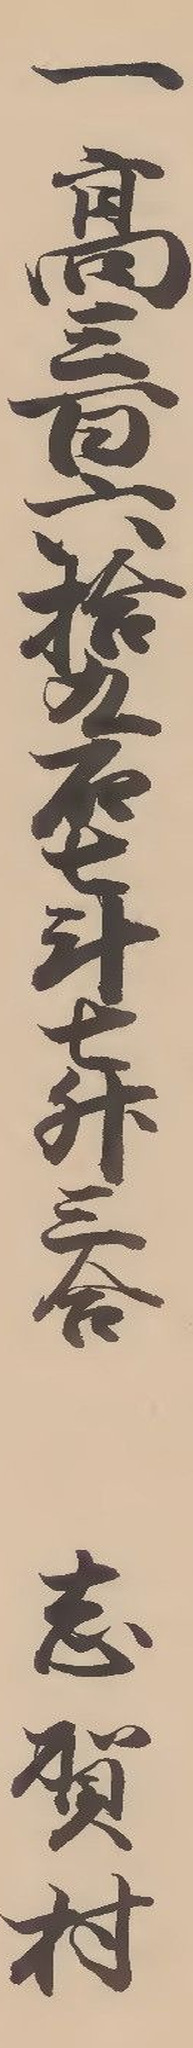一高三百六拾九石七斗七升三合志賀村
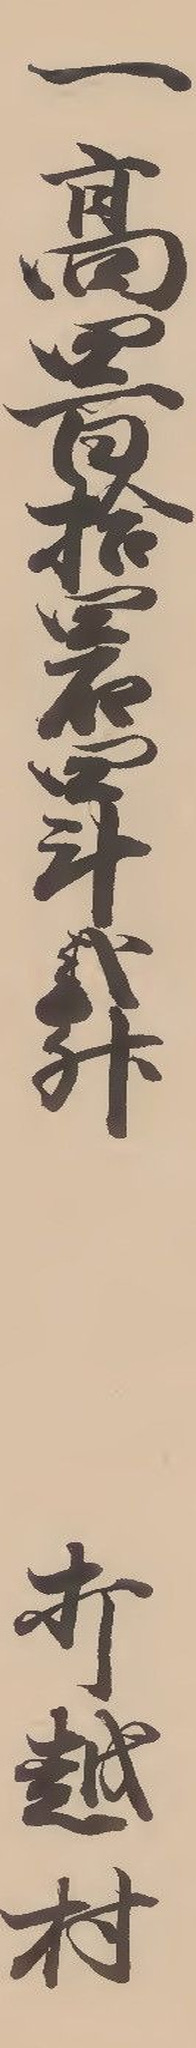一高四百拾四石四斗弐升打越村
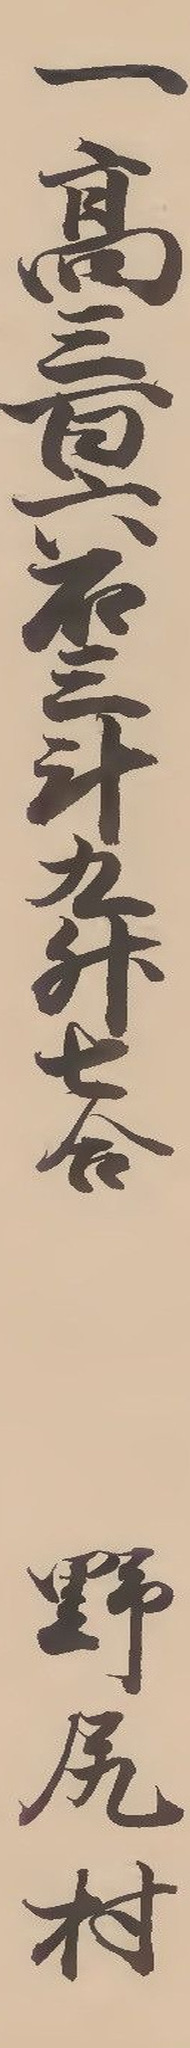一高三百六石三斗九升七合野尻村
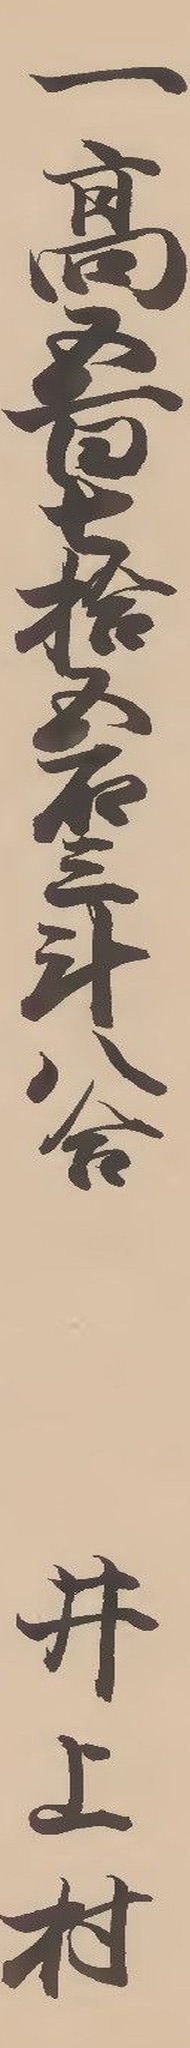一高五百七拾五石三斗八合井上村
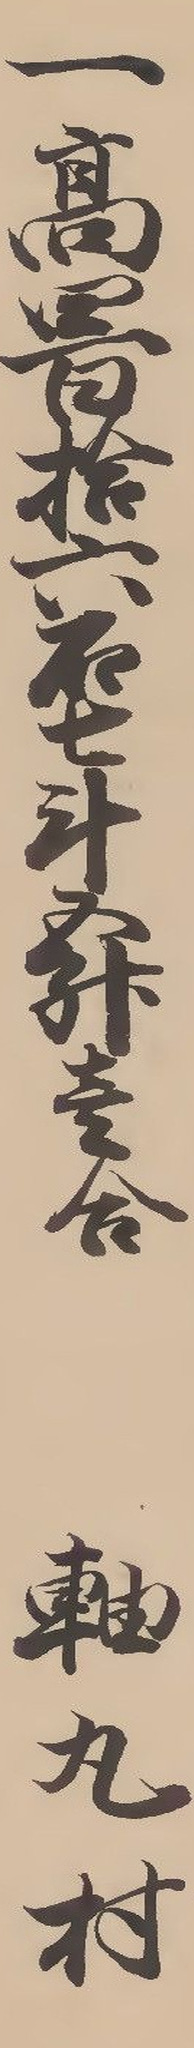一高四百拾六石七斗五升壱合軸丸村
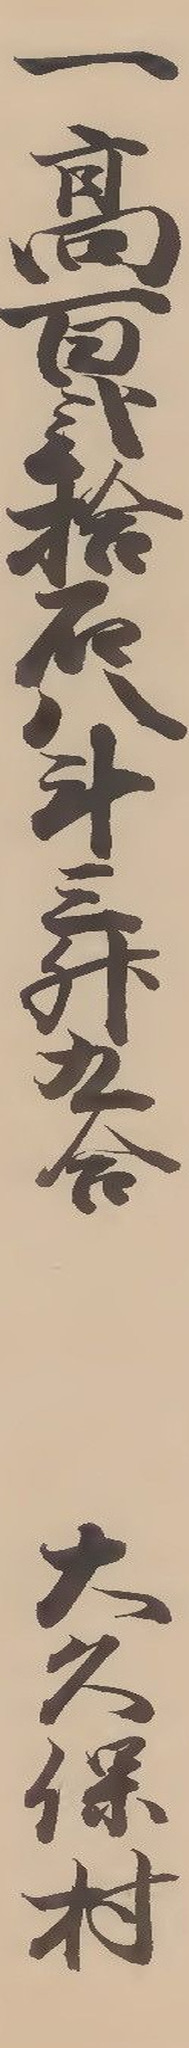一高百弐拾石八斗三升九合大久保村
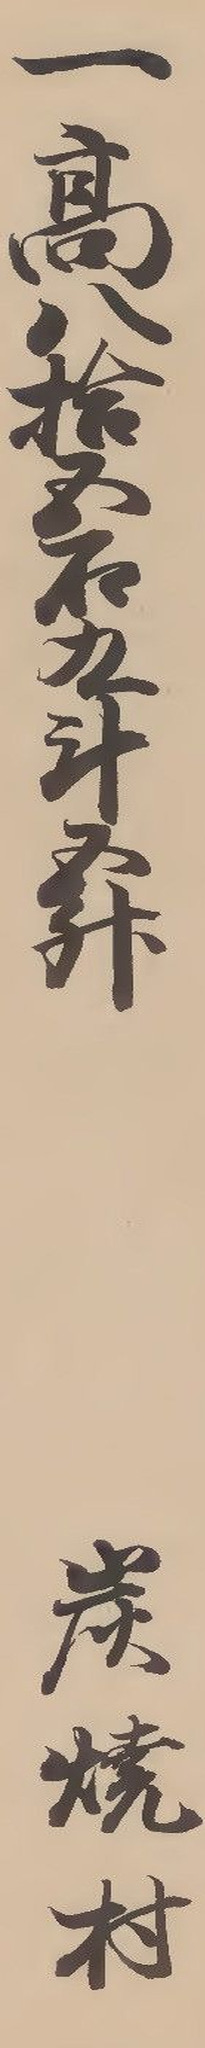一高八拾五石九斗五升炭焼村
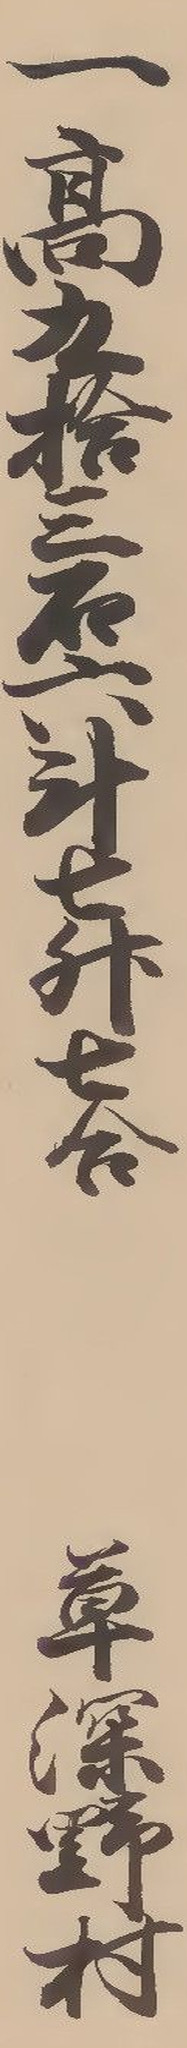一高九拾三石六斗七升七合草深野村

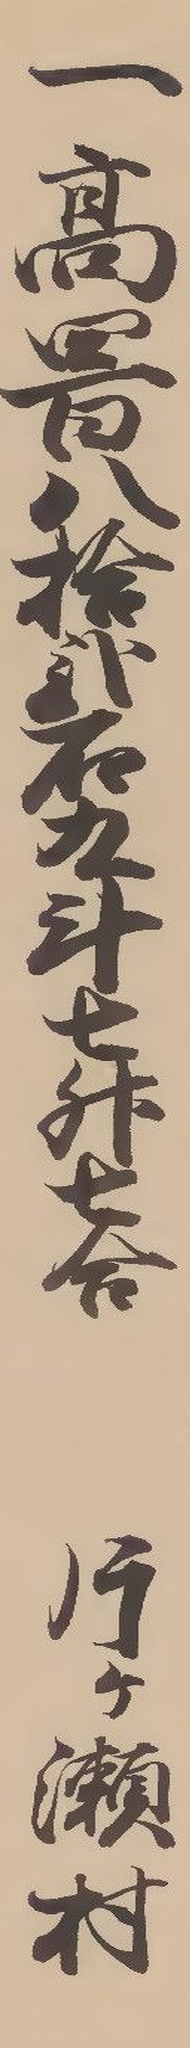一高四百八拾弐石九斗七升七合片ヶ瀬村
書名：豊後国郷帳
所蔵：国立公文書館 National Archives of Japan
